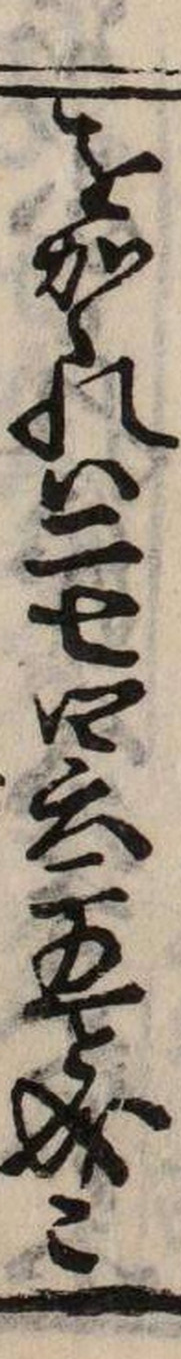をかくれは二七四六二五と成こ
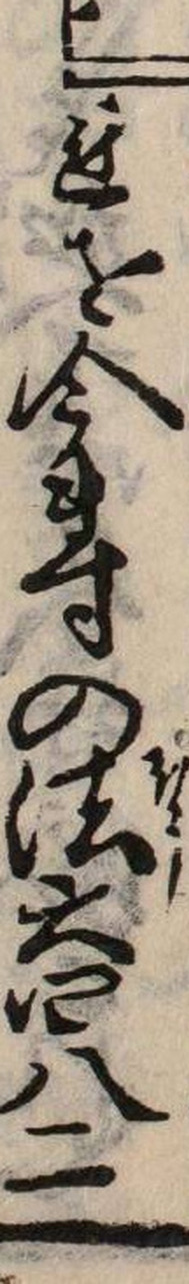れを今ますの法六四八二
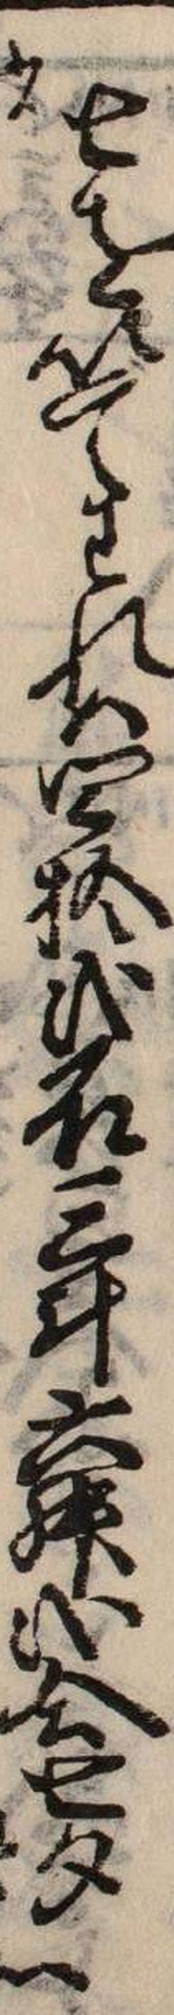七を以てわれは四拾弐石三斗六升弐合七勺と云
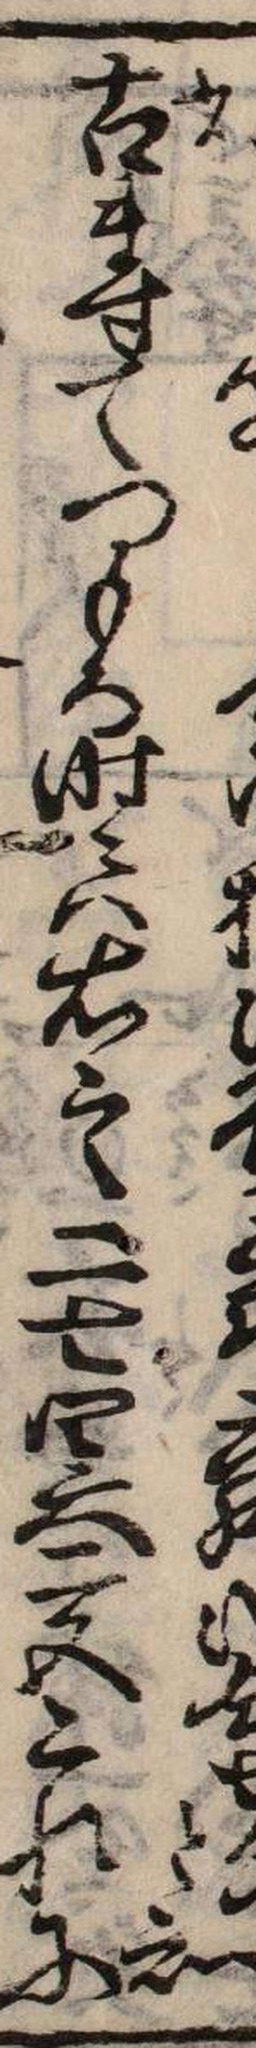古ますてつもる時には右之二七四六二五これに
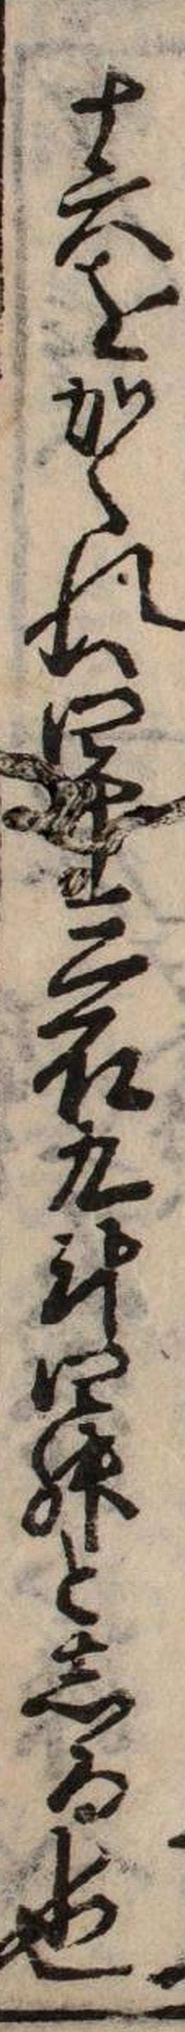十六をかくれは四十三石九斗四升としる也

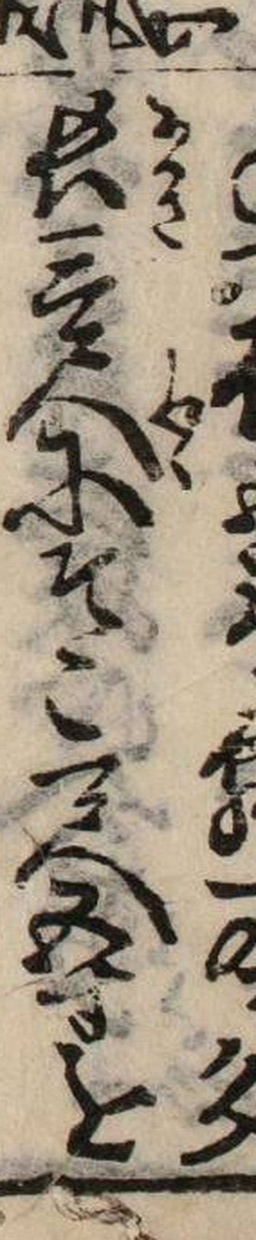長三尺にそこ一尺五寸を
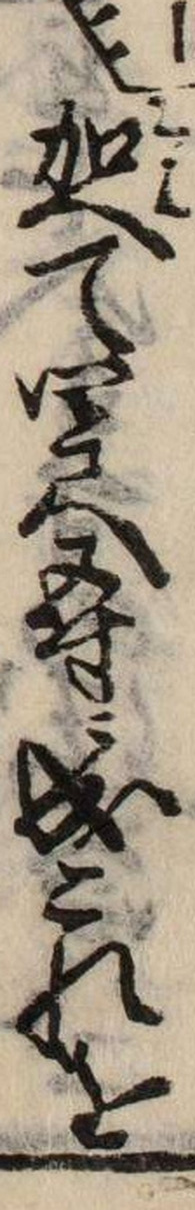加へて四尺五寸に成これを
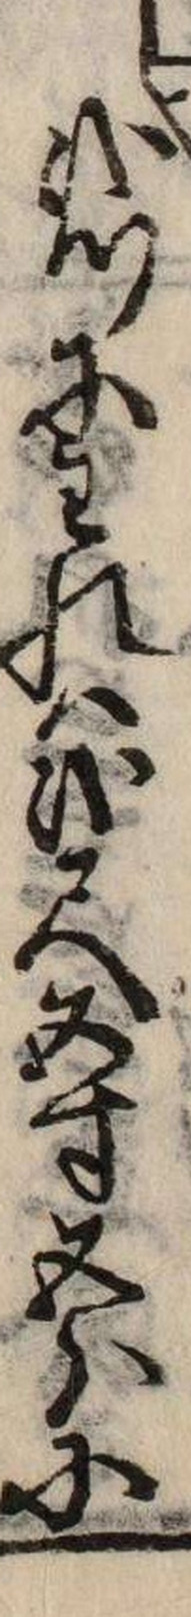弐つにわれは弐尺五寸五分に
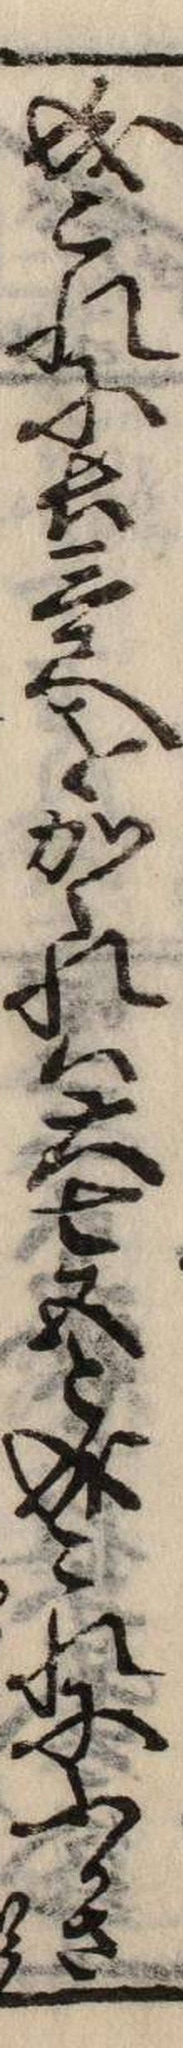成これに長三尺をかくれは六七五と成これにふかさ
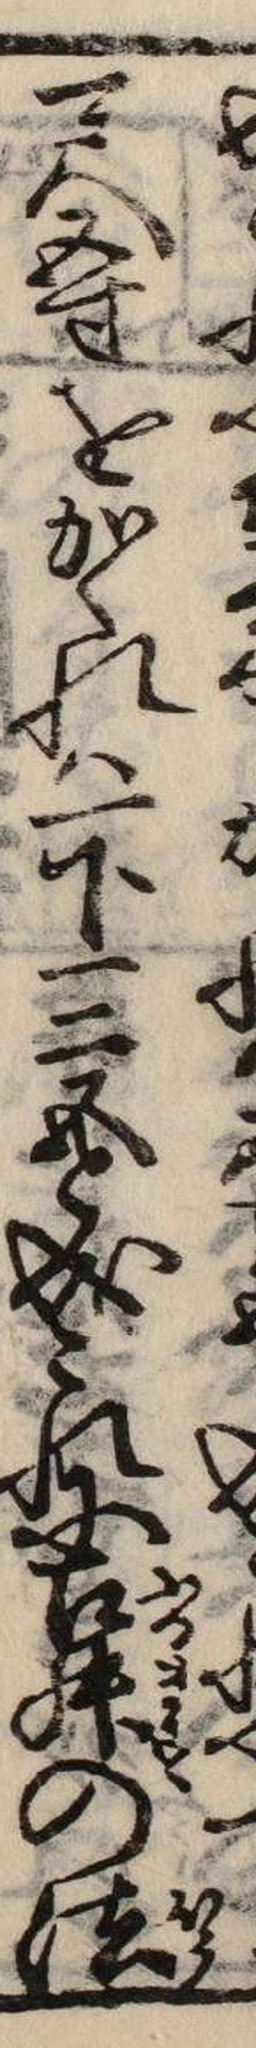一尺五寸をかくれは一下一二五と成これに古舛の法
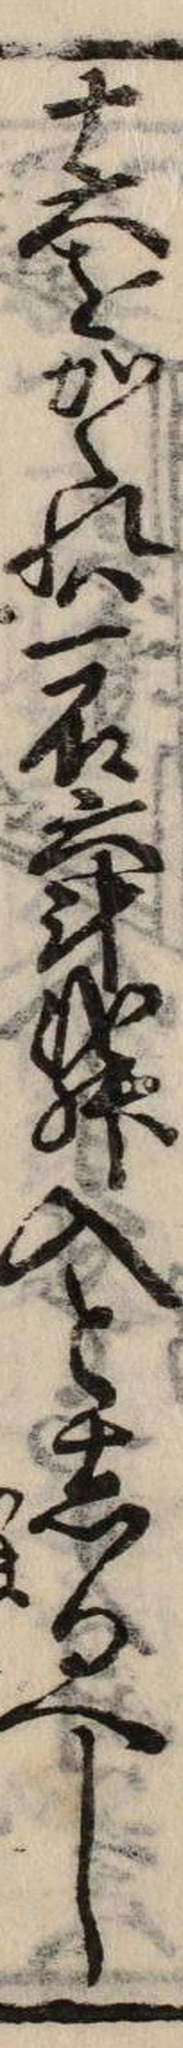十六をかくれは一石六斗弐升入としるへし
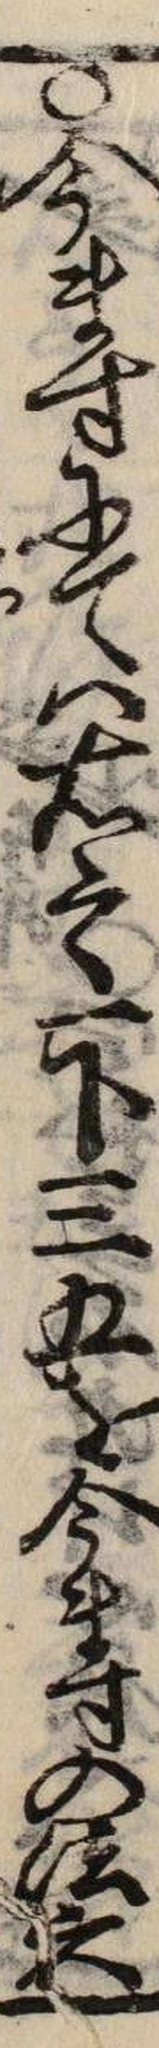○今ますにては右之一下三五を今ますの法六
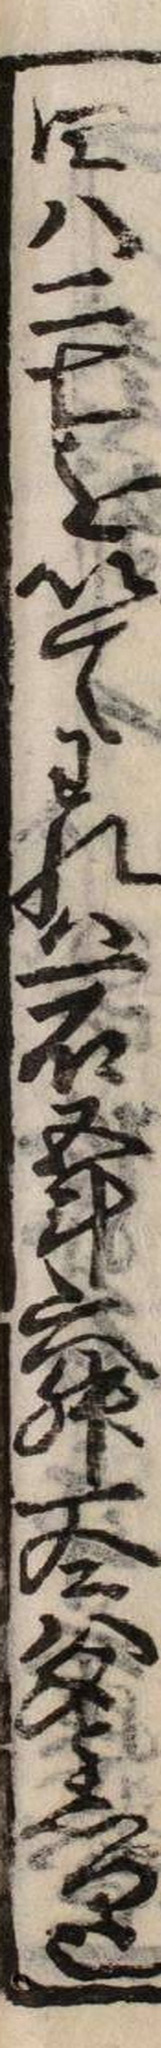四八二七を以てわれは一石五斗六升一合八勺としる也
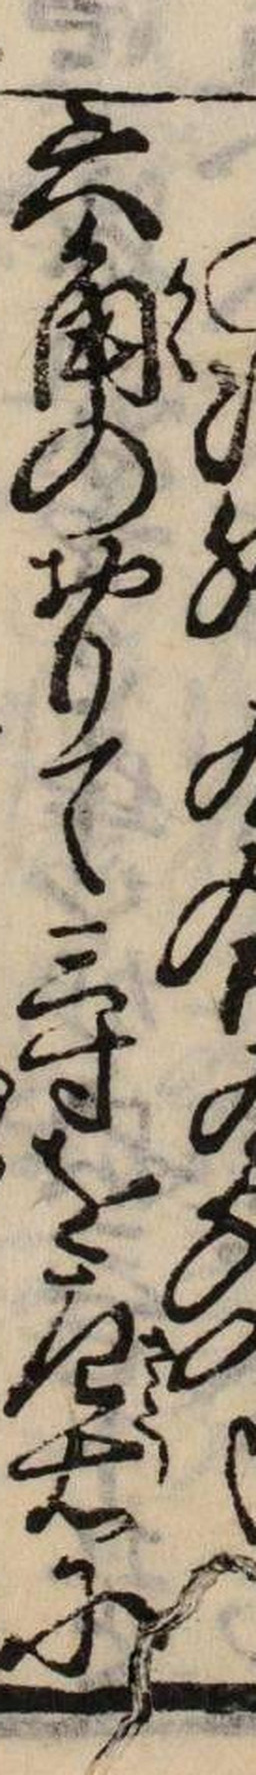六角のおもて三寸を左右に
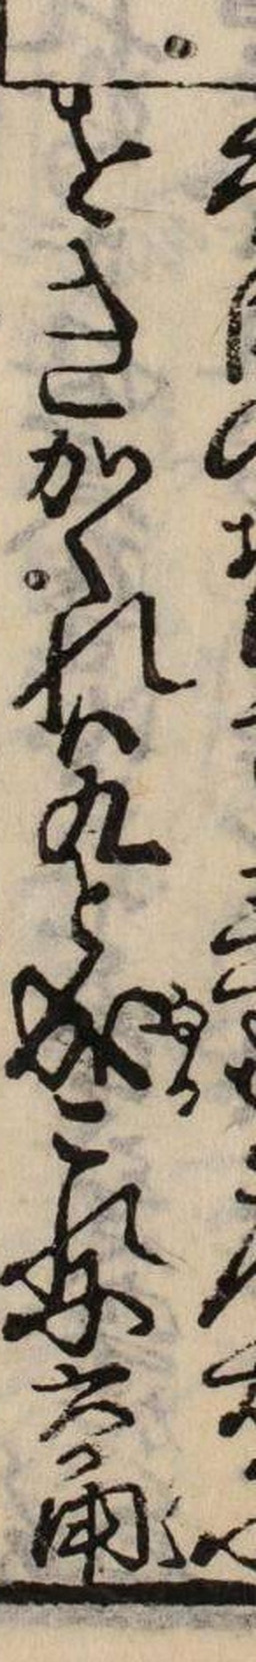をきかくれは九と成これに六角
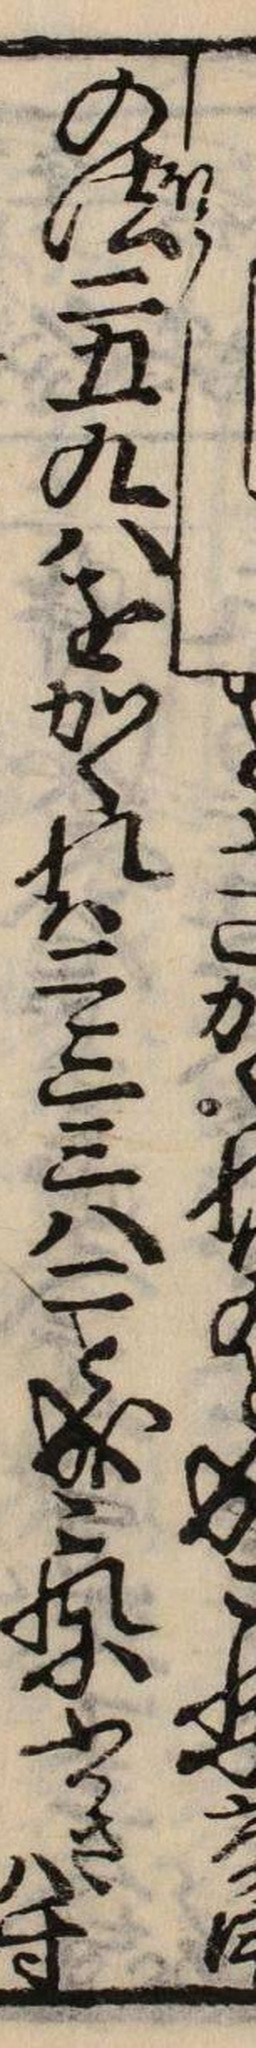の法二五九八をかくれは二三三八二と成これにふかさ八寸
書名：塵劫記（寛永11年自跋、京都府立京都学・歴彩館追貴8）
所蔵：京都府立京都学・歴彩館 国文学研究資料館
